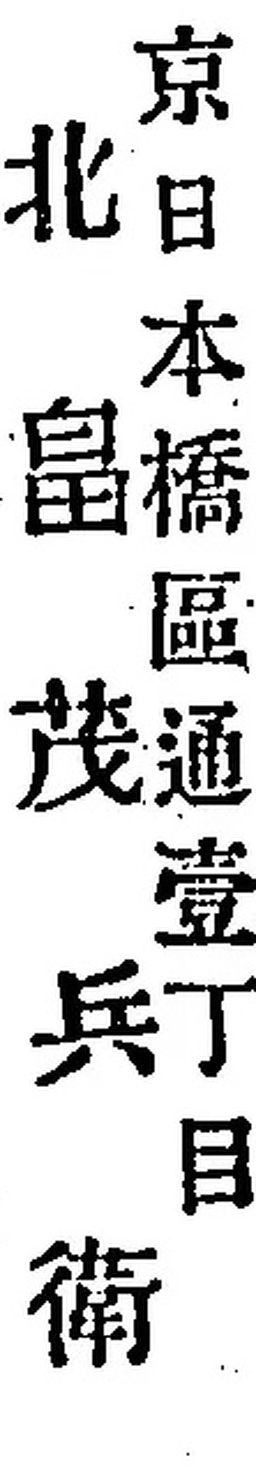北畠茂兵衛
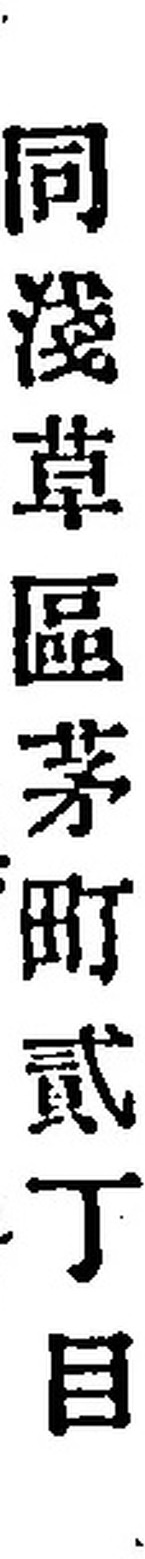同淺草區茅町貳丁目
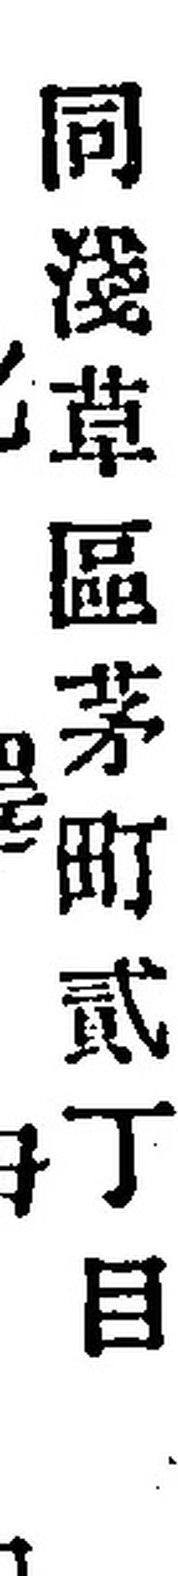同淺草區茅町貳丁目
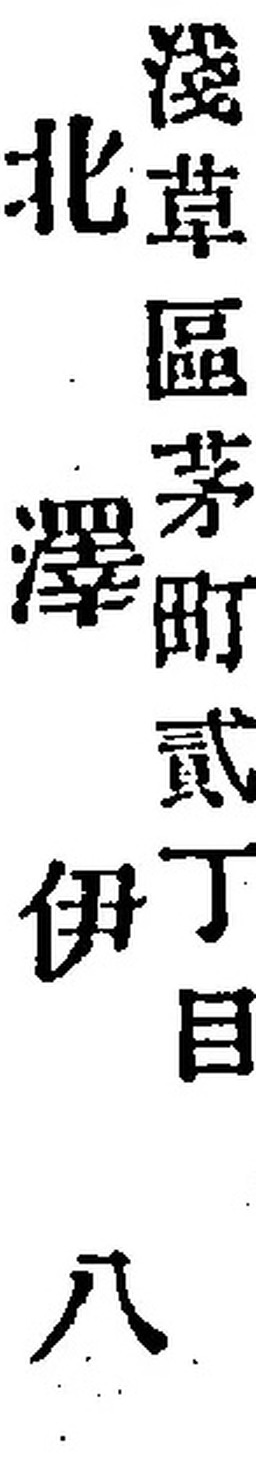北澤伊八
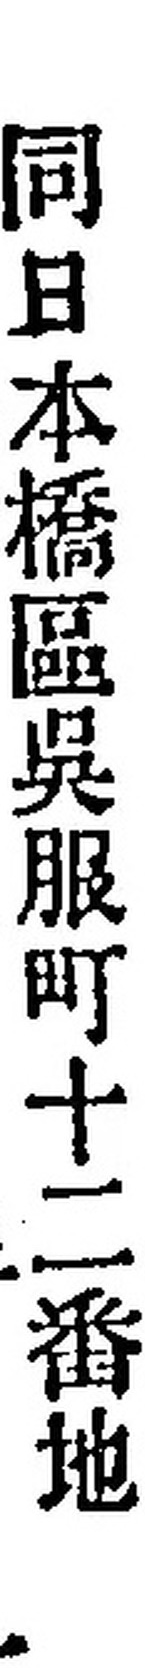弘同日本橋區呉服町十二番地
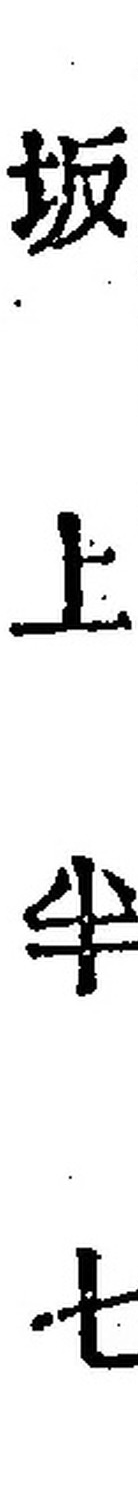坂上半七

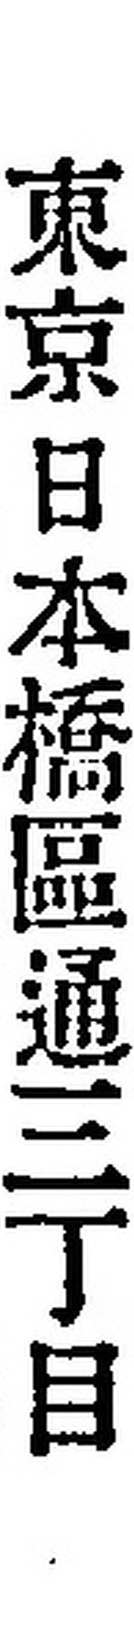東京日本橋區通三丁目
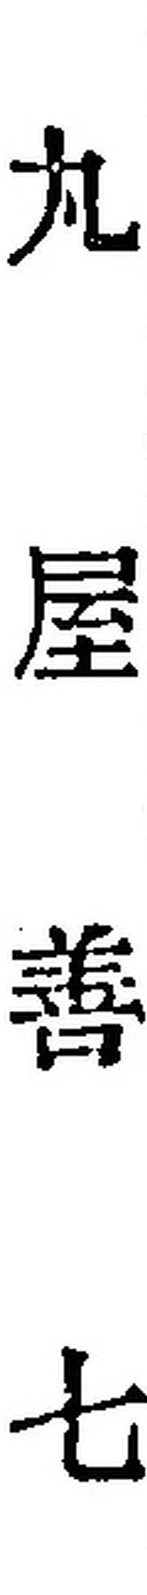丸屋善七
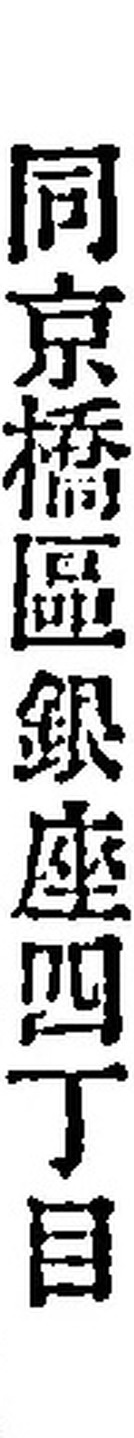同京橋區銀座四丁目
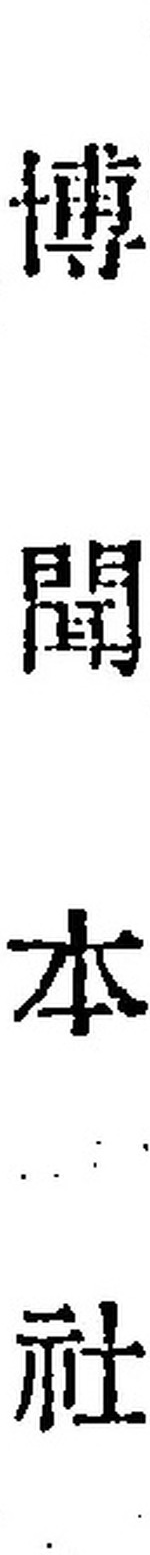博聞本社
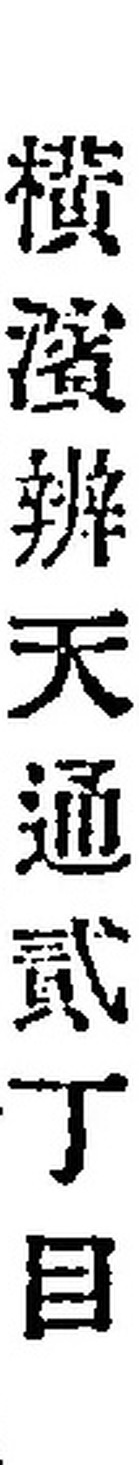書横浜辨天通貳丁目
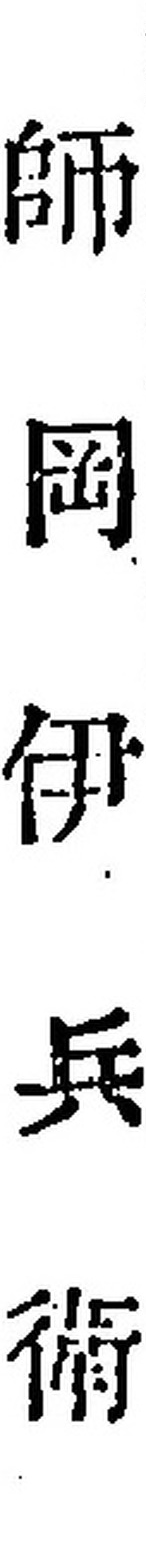師岡伊兵衛
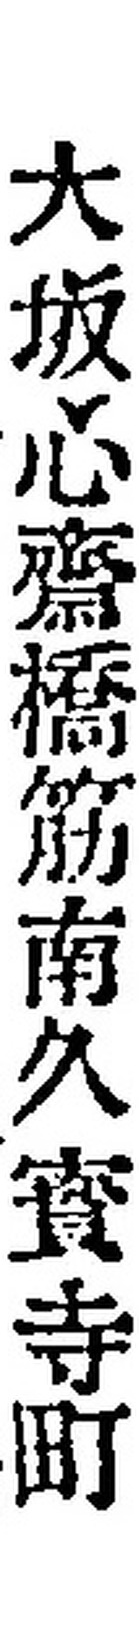大坂心齋橋筋南久寳町
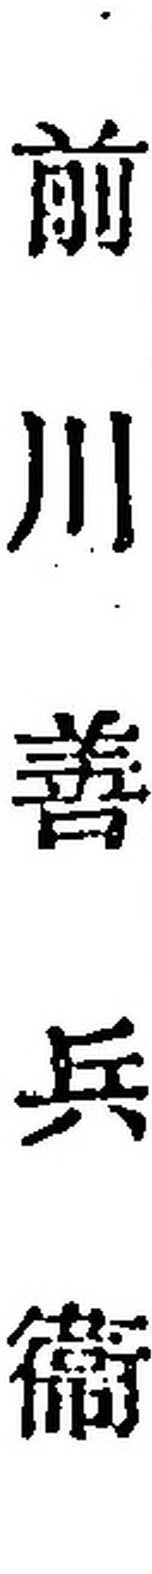前川善兵衛
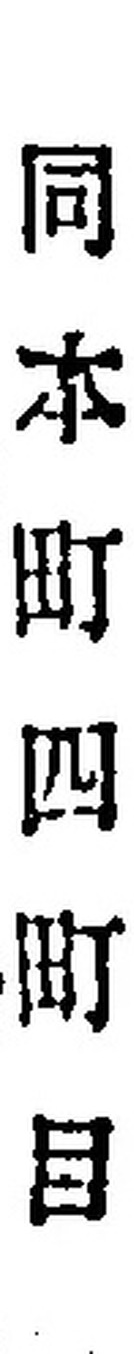弘同本町四町目
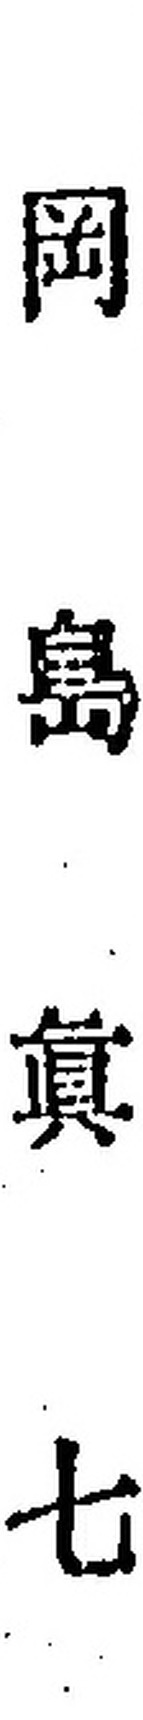岡島眞七
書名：飲水の心得 : 伝染病の予防
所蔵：国立国会図書館 National Diet Library, JAPAN
